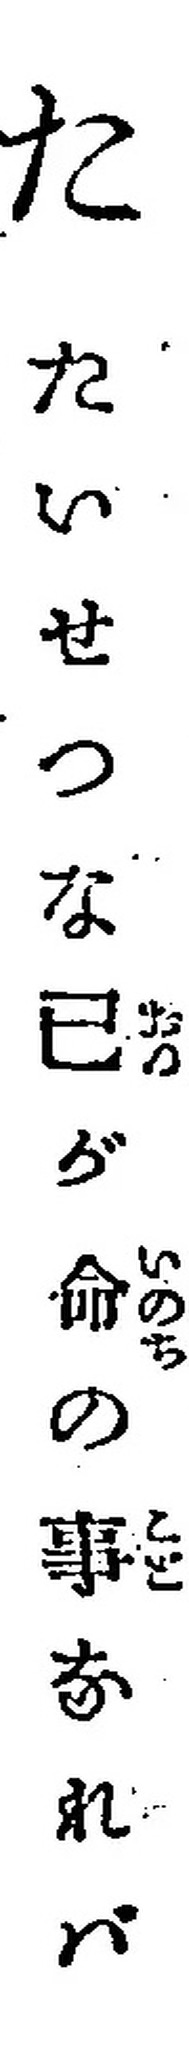たたいせつな己が命の事なれば
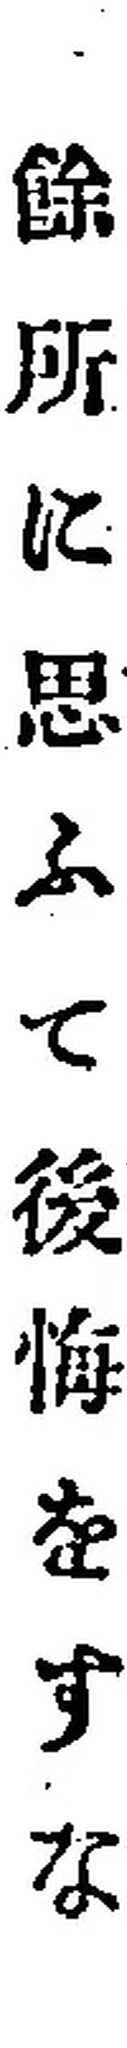餘所に思ふて後悔をすな
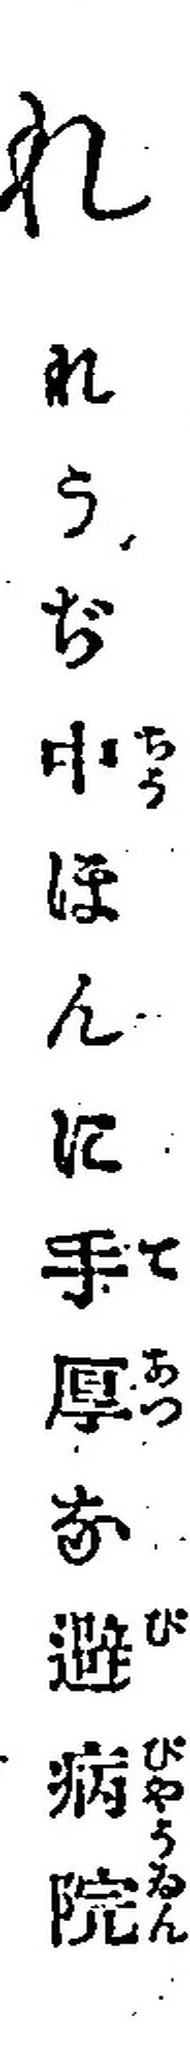れれうぢ中ほんに手厚な避病院
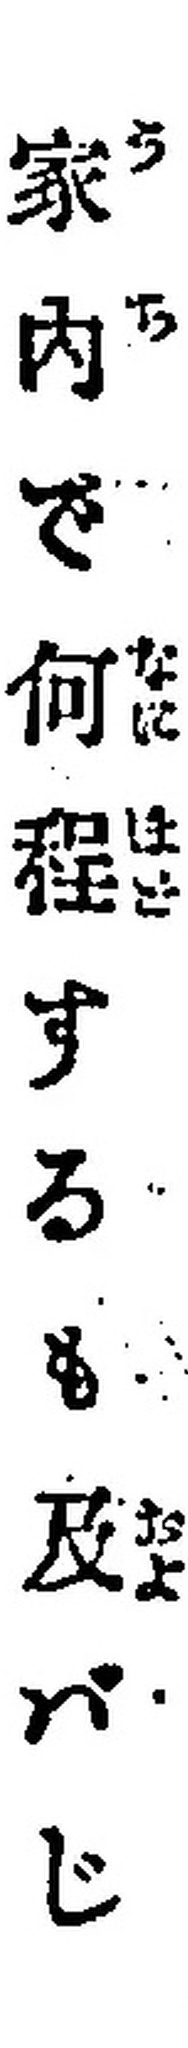家内で何程するも及ばじ
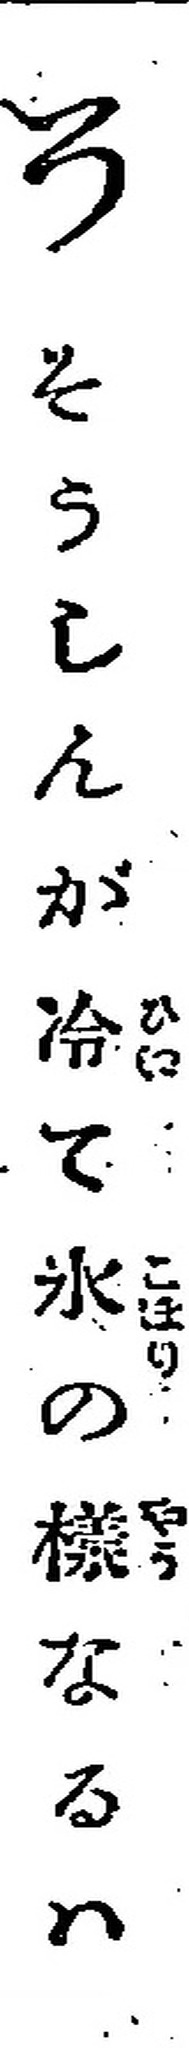そそうしんが冷て氷の様なるは
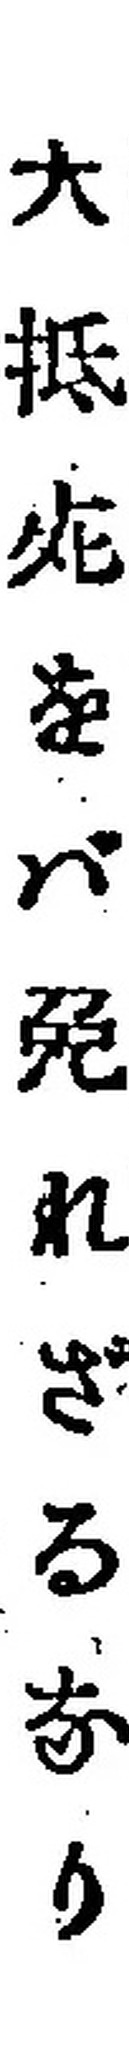大抵死をば免れざるなり
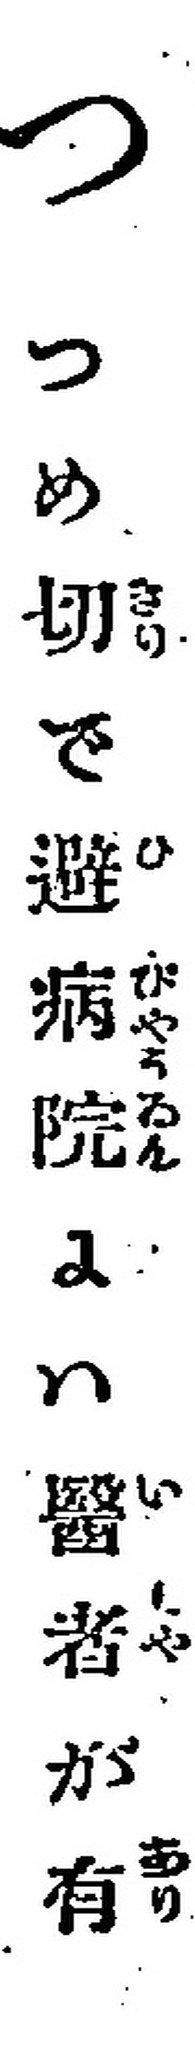つつめ切で避病院には醫者が有
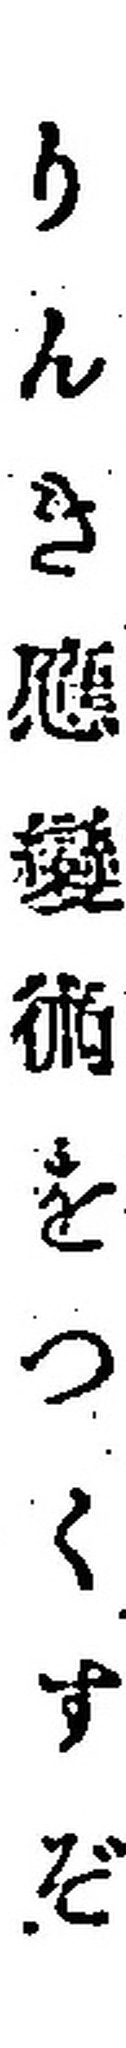りんき応変術をつくすぞ
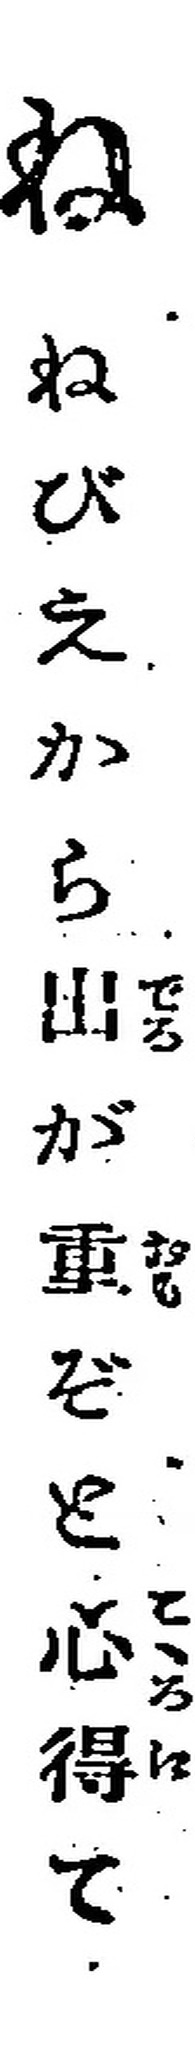ねねびえから出が重ぞと心得て
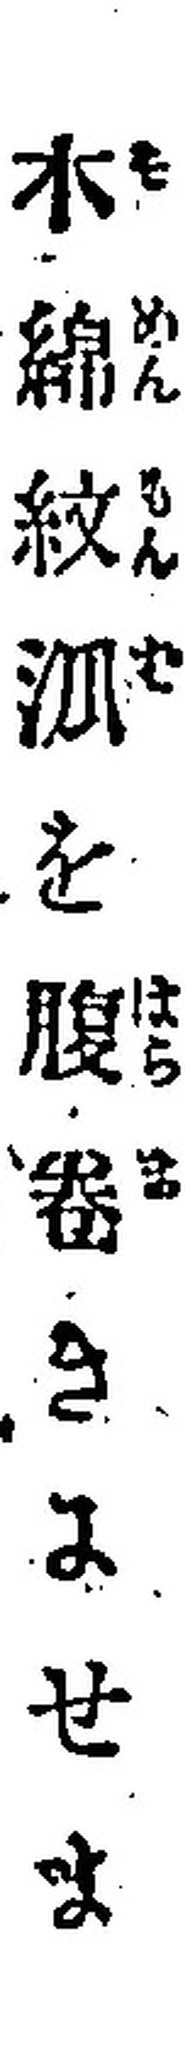木綿紋派を腹巻きにせよ
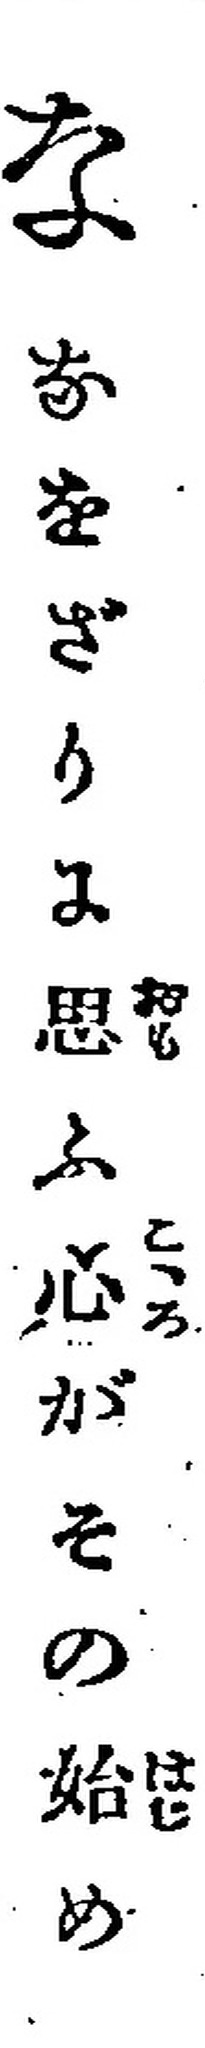ななをざりに思ふ心がその始め
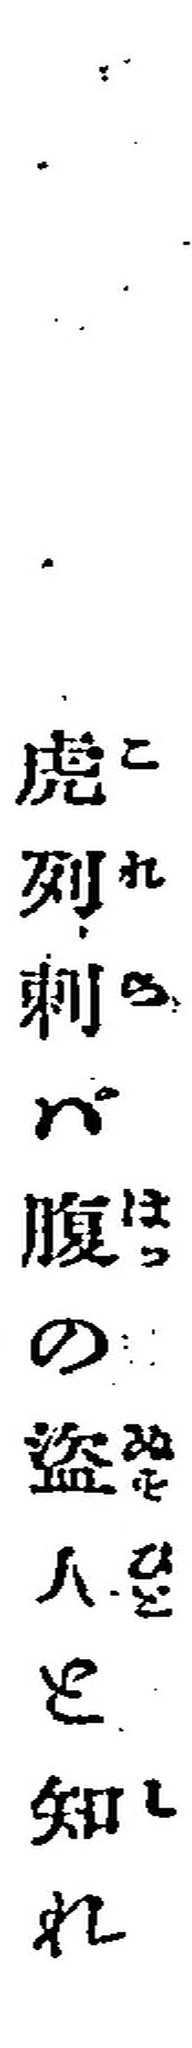虎列刺ば腹の盗人と知れ
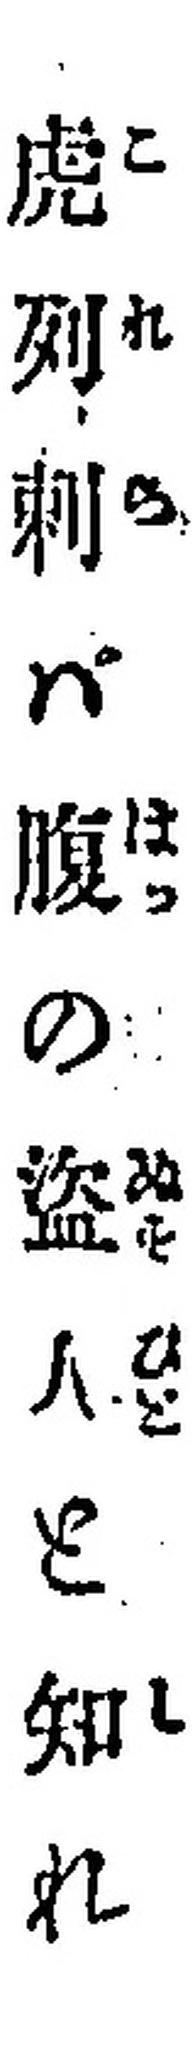虎列刺ば腹の盗人と知れ
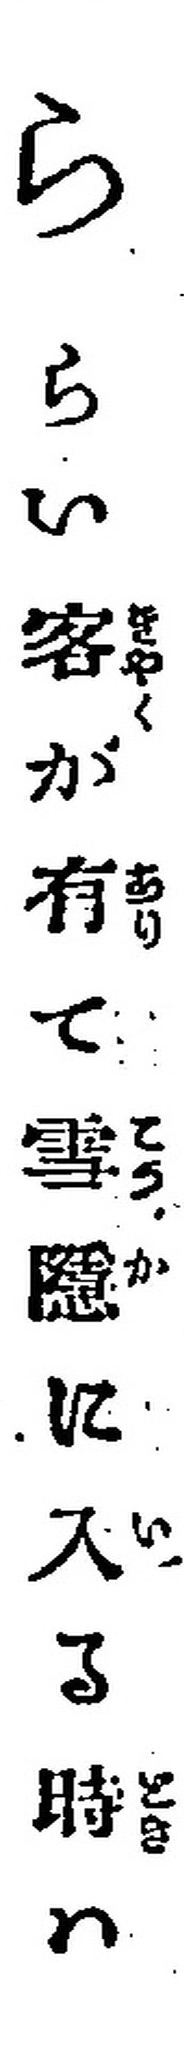ららい客が有て雪隠に入る時は
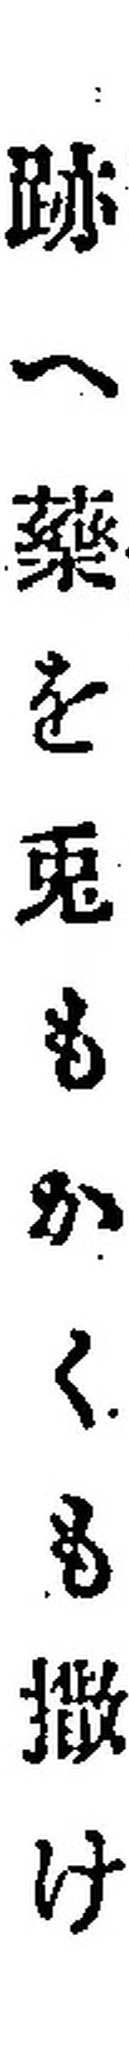跡へ藥を兎もかくも撒け
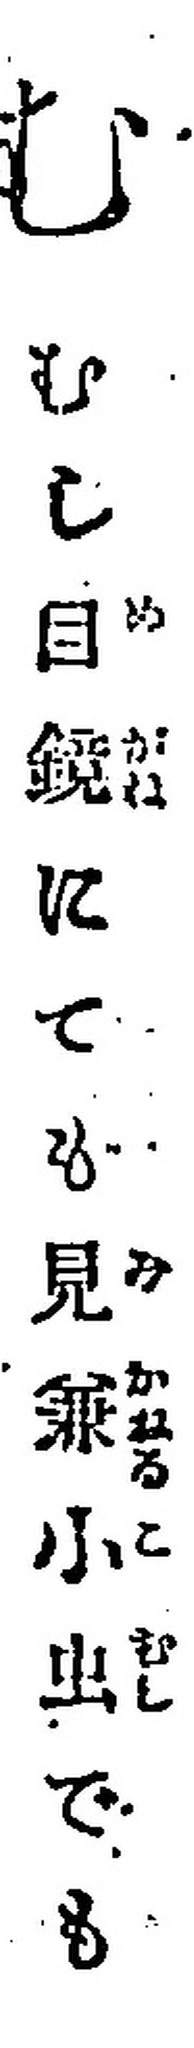むむし眼鏡にても見兼小虫でも
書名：新撰暑中養生法 : 附・コレラ予防歌
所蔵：国立国会図書館 National Diet Library, JAPAN
